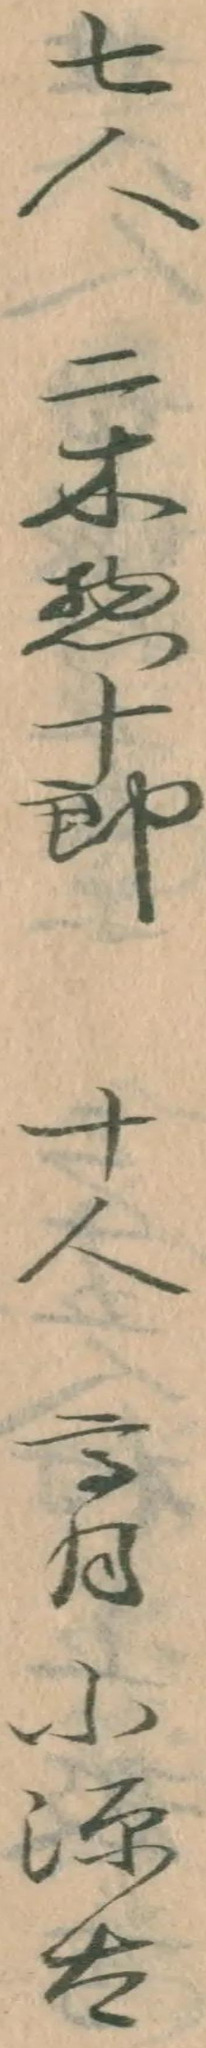七人二木惣十郎十人高月小源太
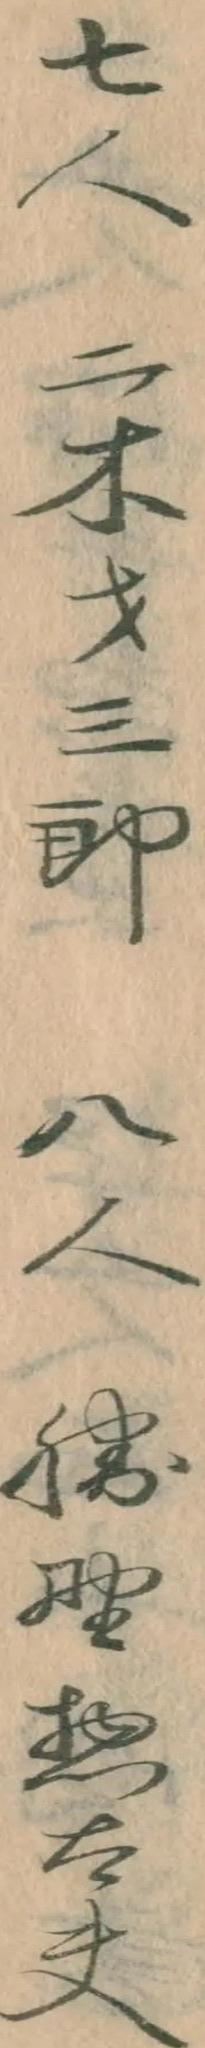七人二木才三郎八人勝野惣太夫
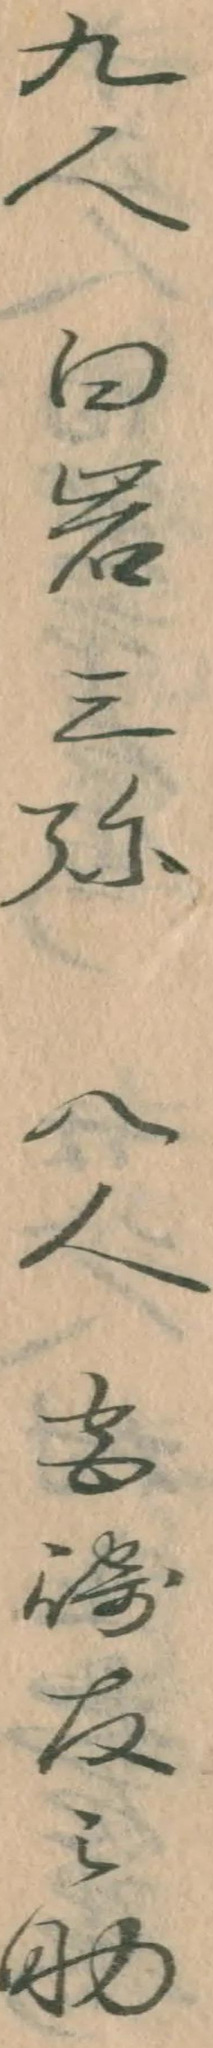九人白岩三弥八人宮崎友之助
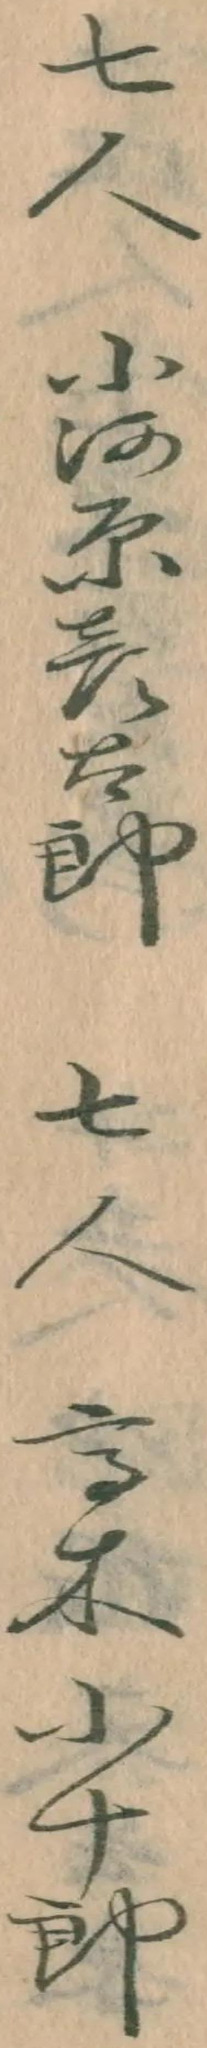七人小河原彦太郎七人高木小十郎
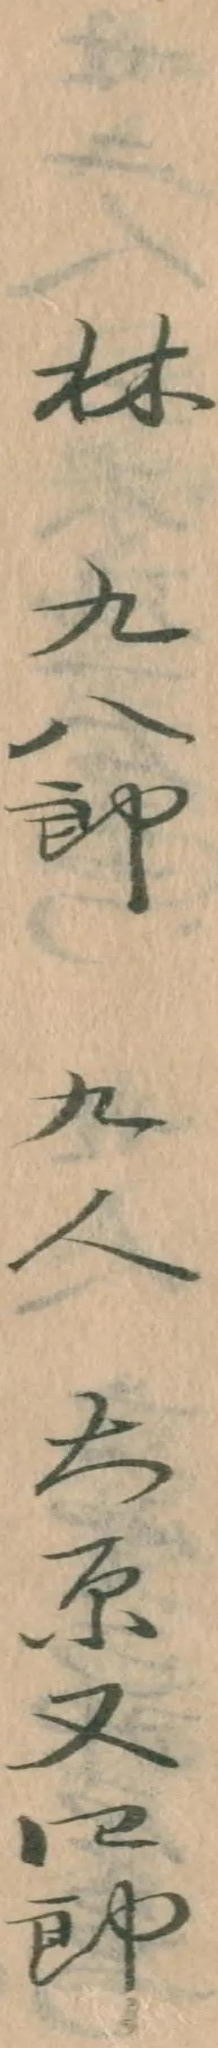林九八郎九人大原又四郎
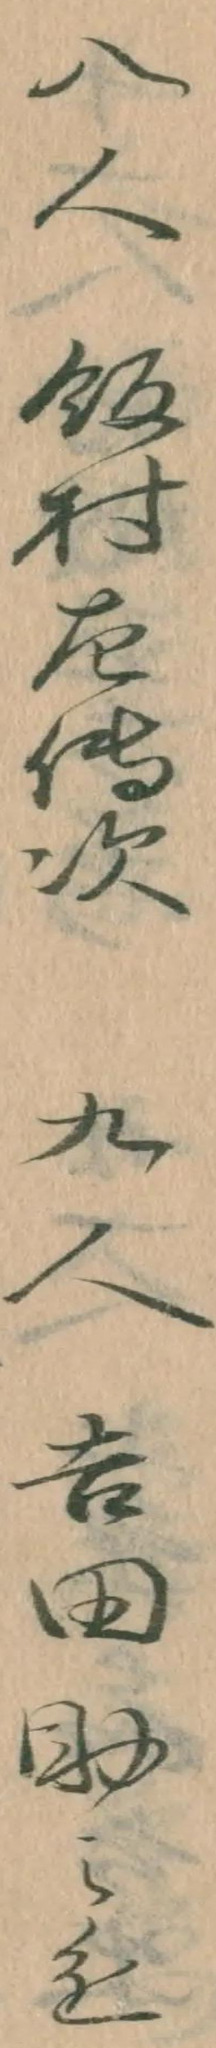八人飯村左伝次九人吉田助之進
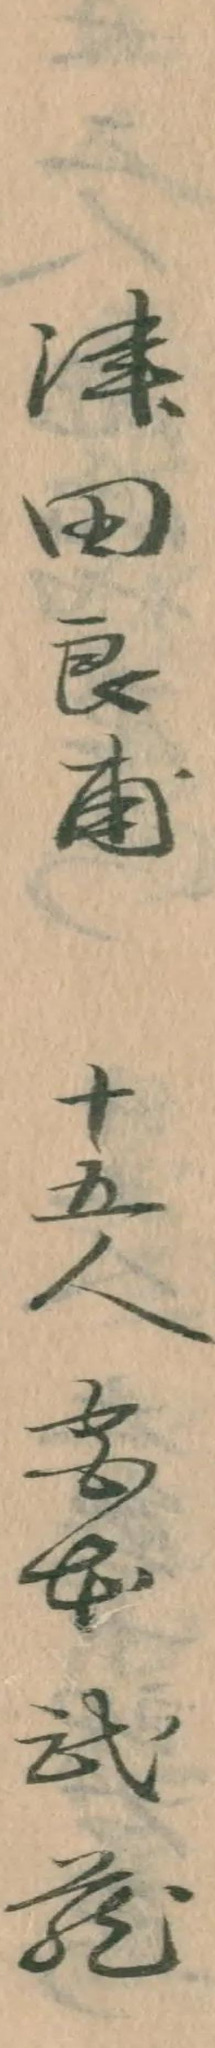津田良甫十五人宮本武蔵
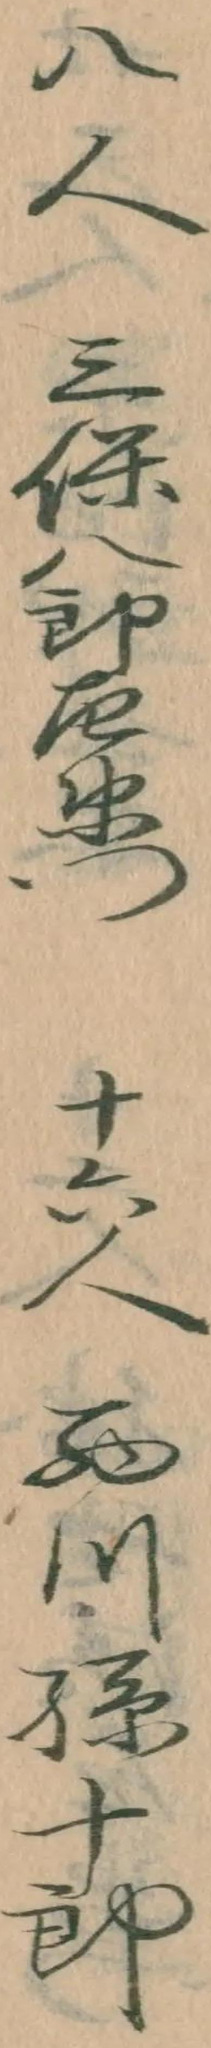八人三保八郎左衛門十六人西川孫十郎
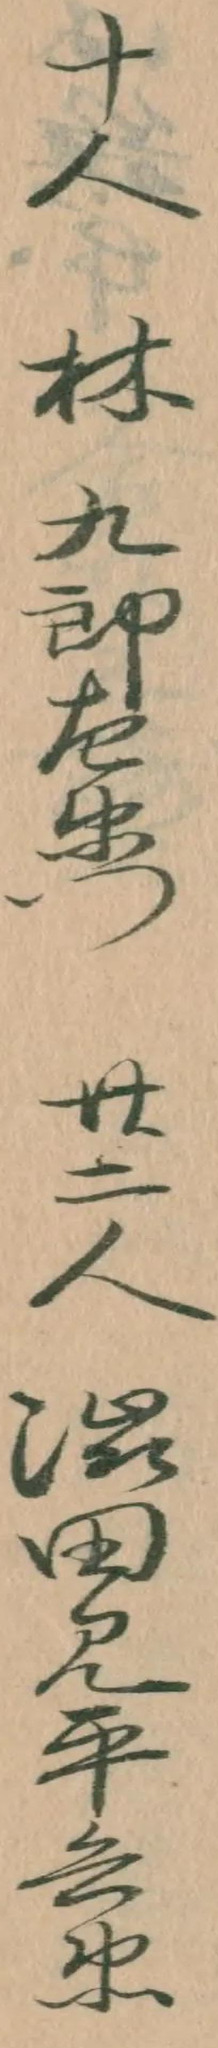十人林九郎左衛門廿二人渋田見平兵衛
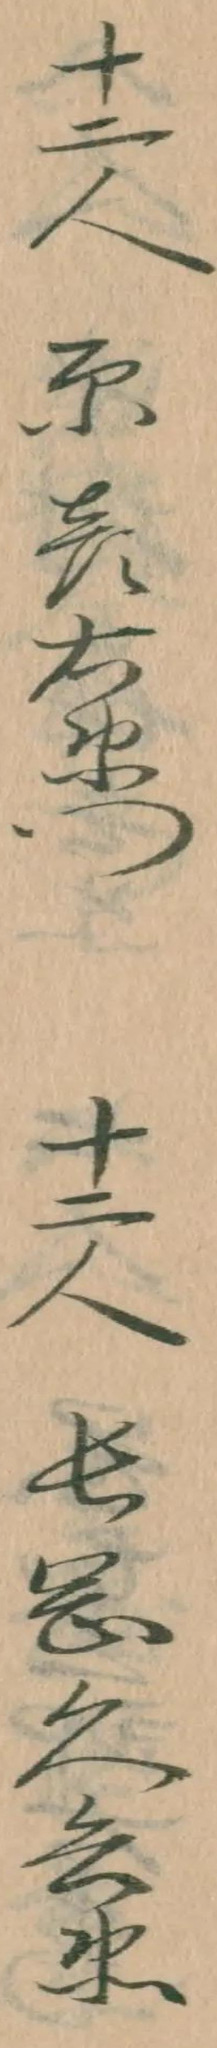十二人原彦右衛門十二人長岡久兵衛
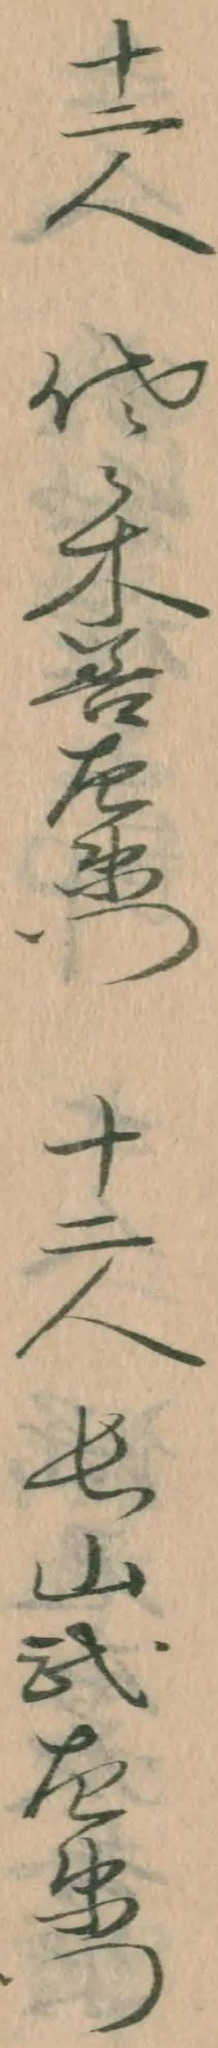十二人佐々木善左衛門十二人長山武左衛門
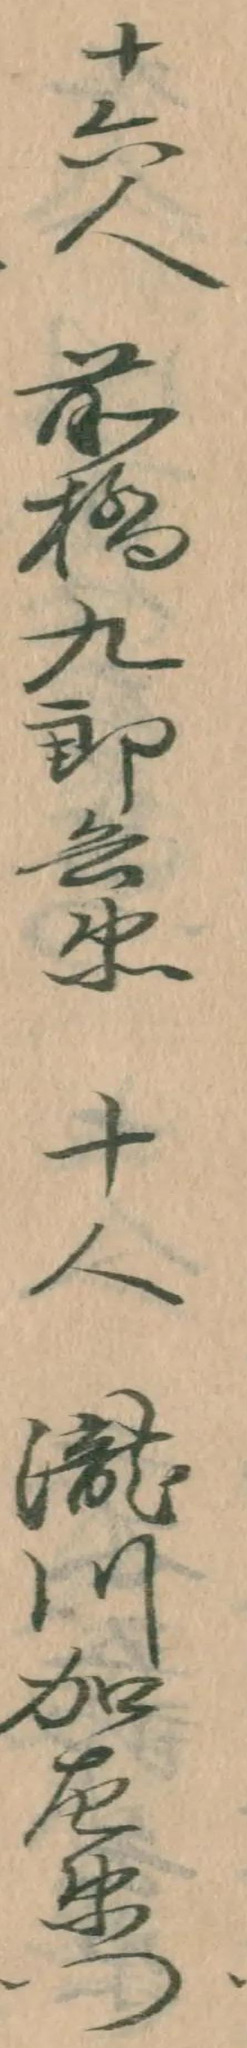十六人前橋九郎兵衛十人瀧川加左衛門
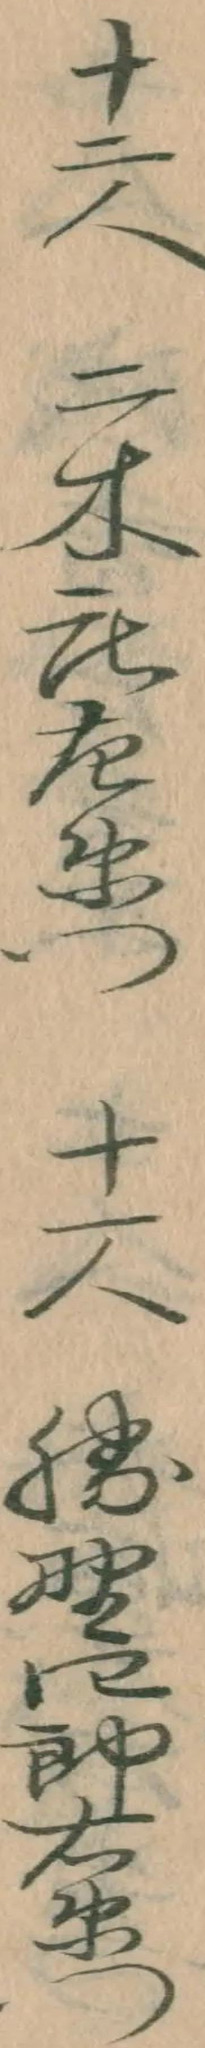十二人二木庄左衛門十一人勝野四郎右衛門
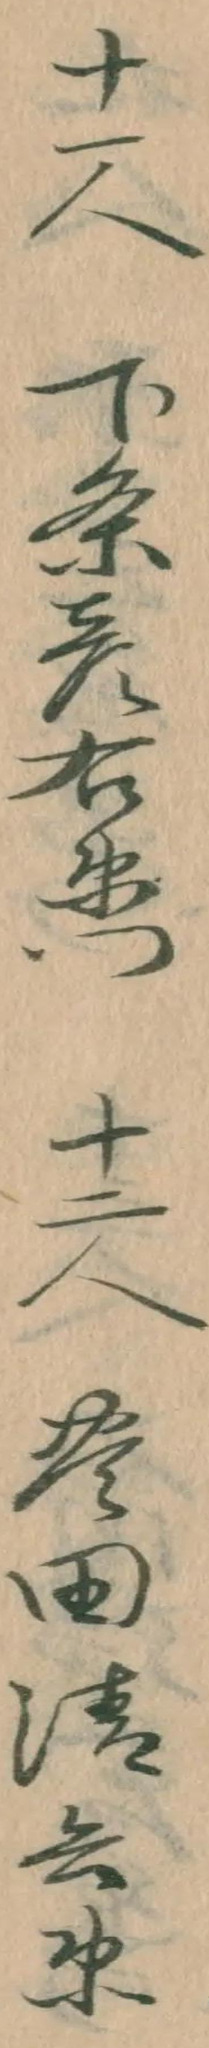十一人下条彦右衛門十二人豊田清兵衛
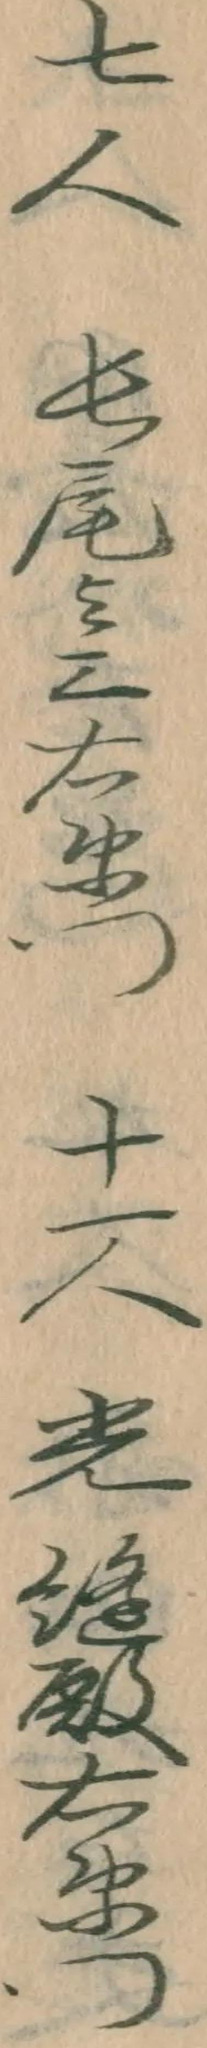七人長尾与三右衛門十一人光縫殿右衛門
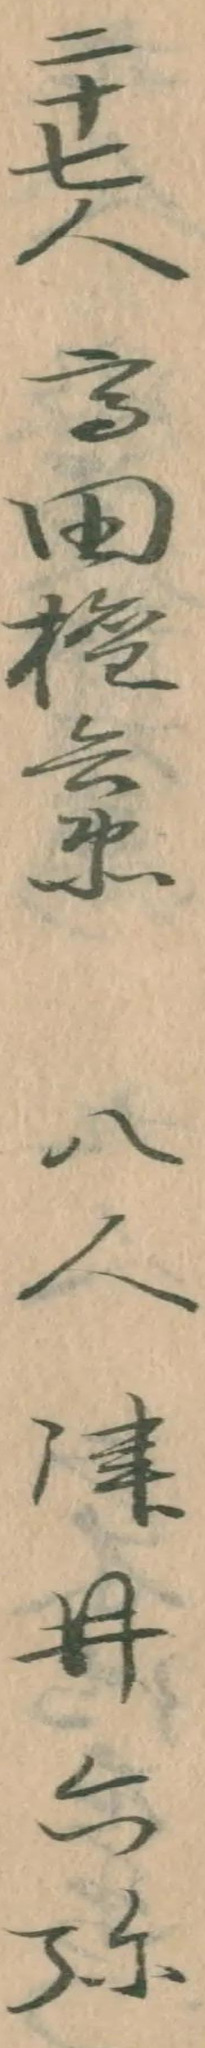二十七人高田権兵衛八人津井六弥
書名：切支丹御退治記 49巻. [6]
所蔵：国立国会図書館 National Diet Library, JAPAN
